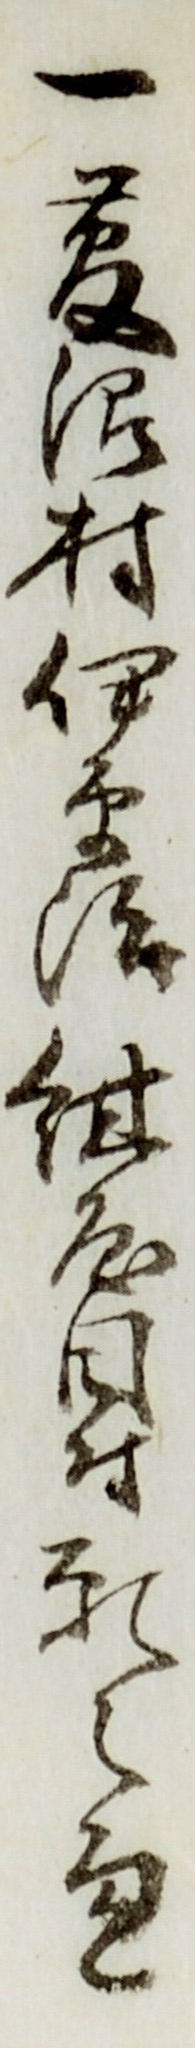一菅沼村伊平治紺屋目付願之通
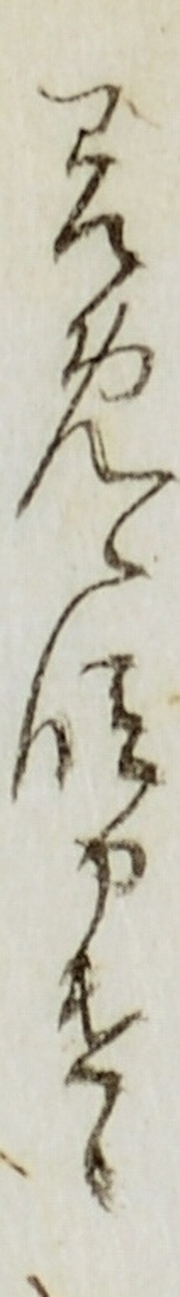差免候段申遣候
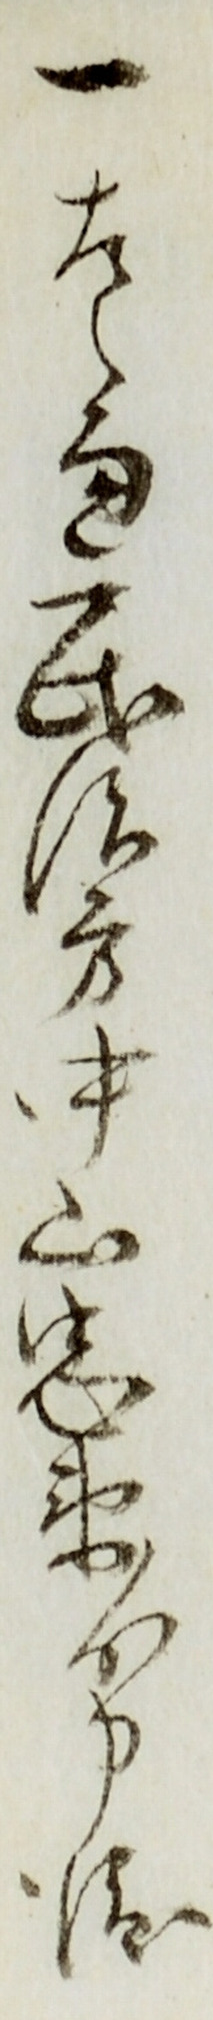一左之通民治方中山忠衛ゟ申渡
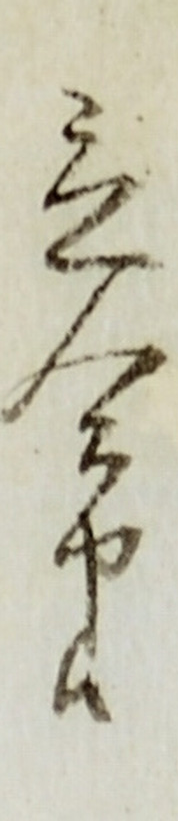立合申候
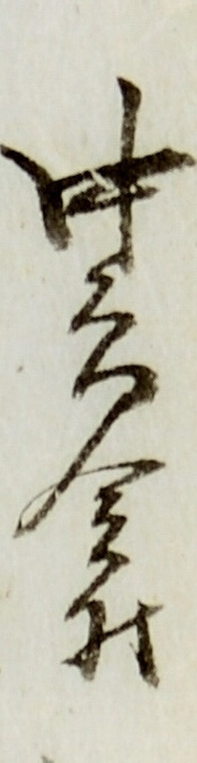中曽倉村
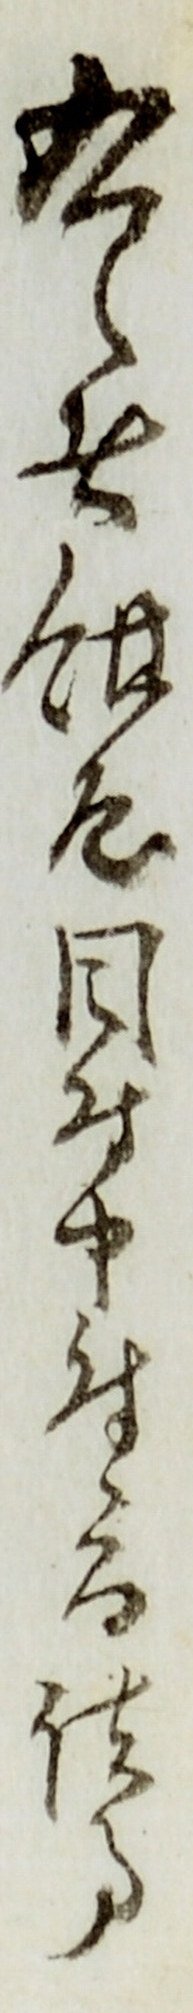右之者紺屋目付申付候間諸事
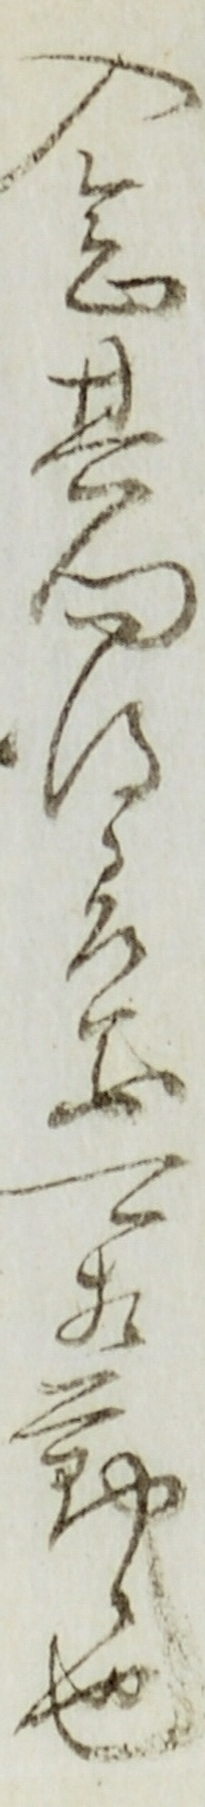入念其向得差図可相勤候也
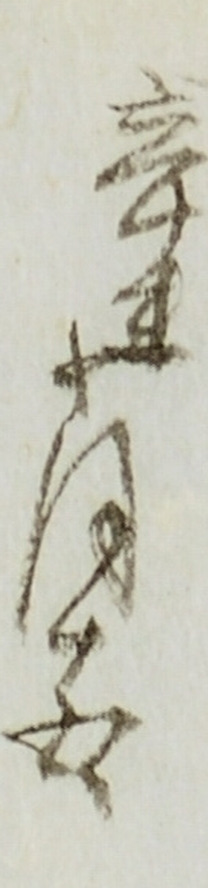辛未十月十五日
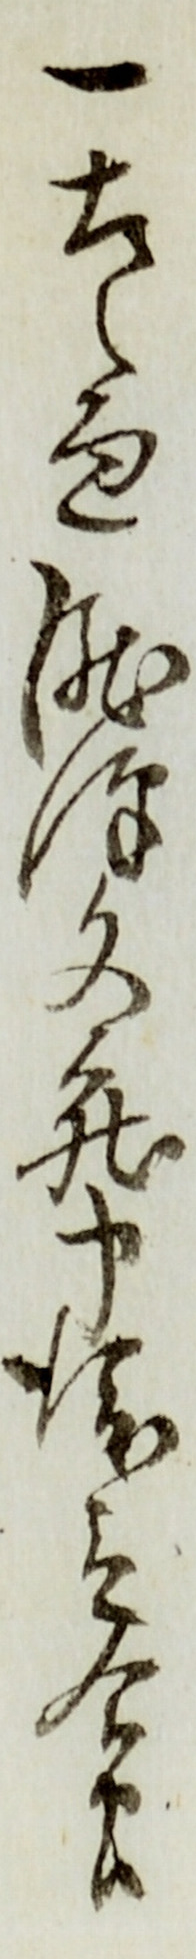一左之通滝沢文蔵申渡立合申候
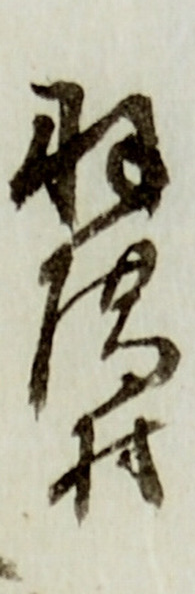羽場村
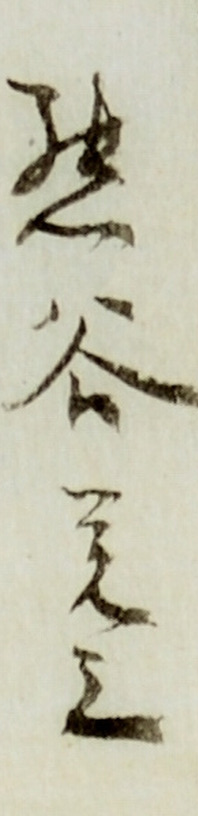熊谷覚三
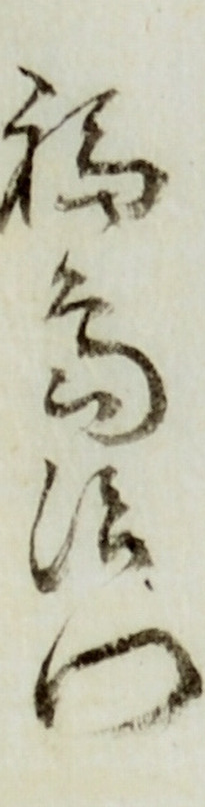福島治門
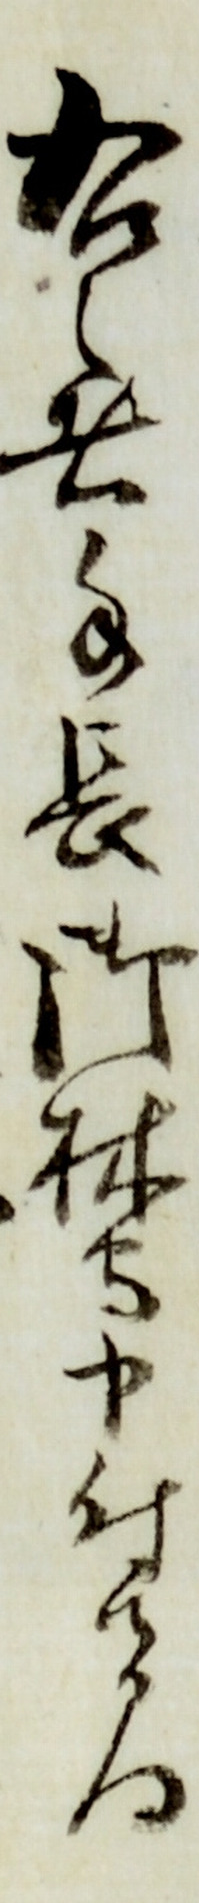右之者年長御林守申付候間
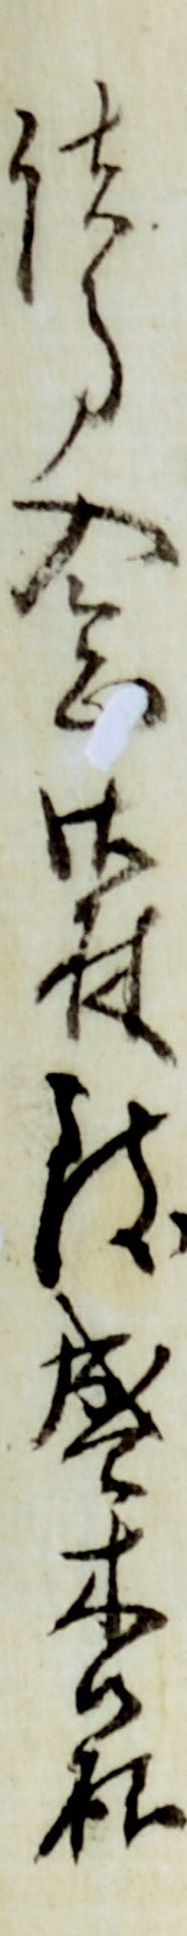諸事入念御林致盛木候様

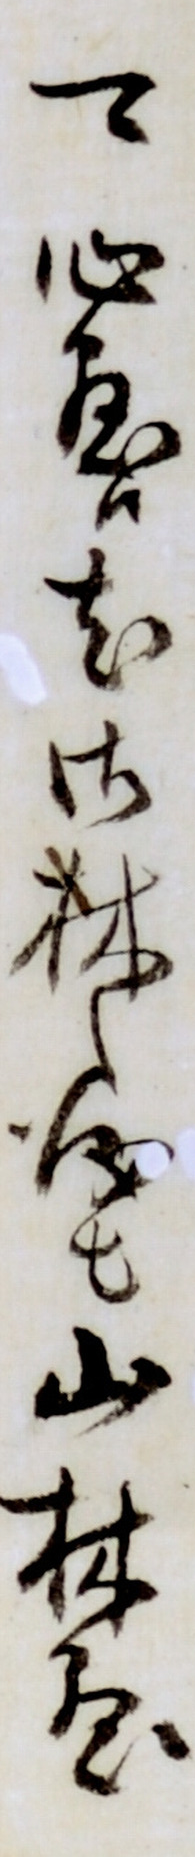可心懸候尤御林之儀も山林懸
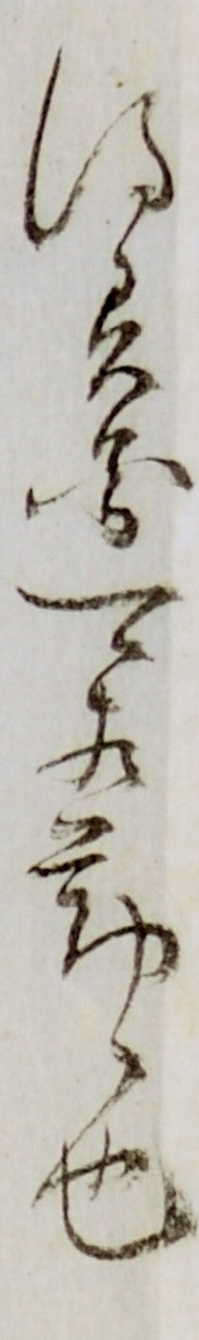得差図可相勤候也
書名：山林方諸事御用留
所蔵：伊那市立高遠町図書館・合同会社AMANE
